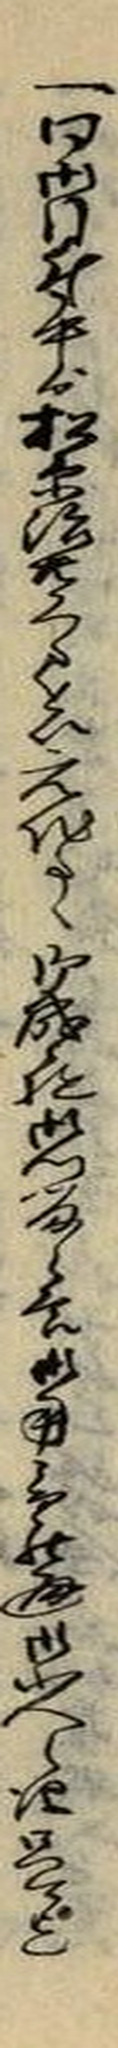一同御目付中ゟ松原治左衛門方を以元作事へ御成被遊御門留之節御用に而罷通御小人之儀只今迄
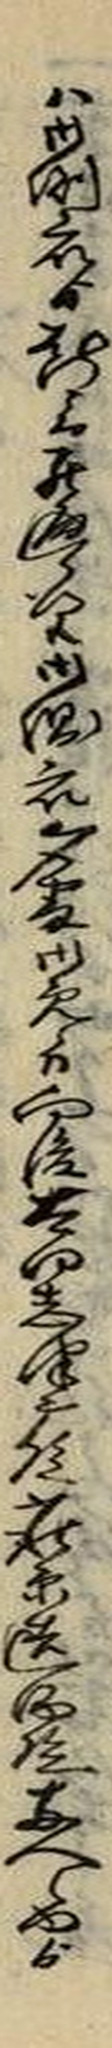は御側衆ゟ断に而罷通候得共御側衆夕番御免に付向後太田志津摩殿荻原造酒殿両人之内ゟ
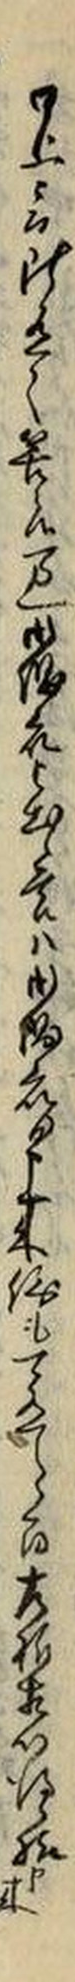口上に而断有之筈に候万一御側衆被出候節は御側衆ゟ申来例も有之候間左様相心得候様申来
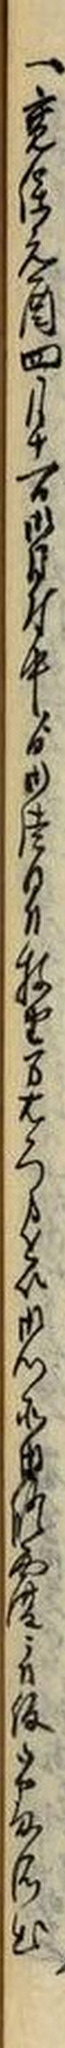一寛保元酉四月十一日御目付中ゟ御徒目付牧野万右衛門方を以御門所御修覆に付仮御番所出
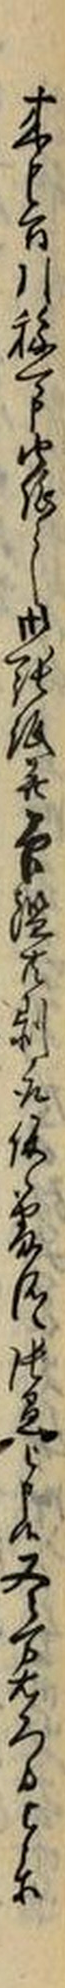来候間引移可申聞依之御張紙并印鑑共剥取仮御番所へ張置被申候又候万右衛門方被参
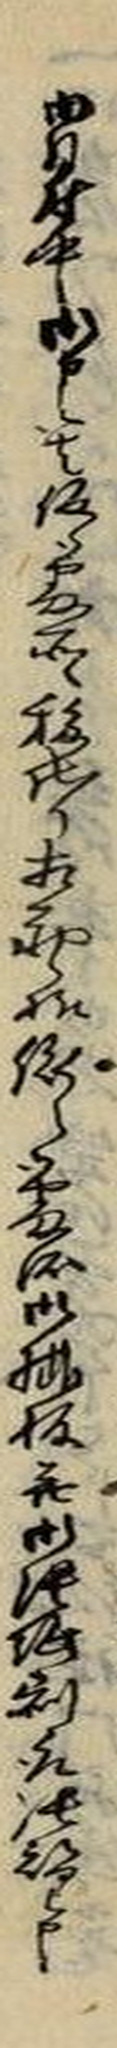御目付中御申候は仮御番所へ移代り相勤候様依之御番所御掛板并御張紙剥取張替被申
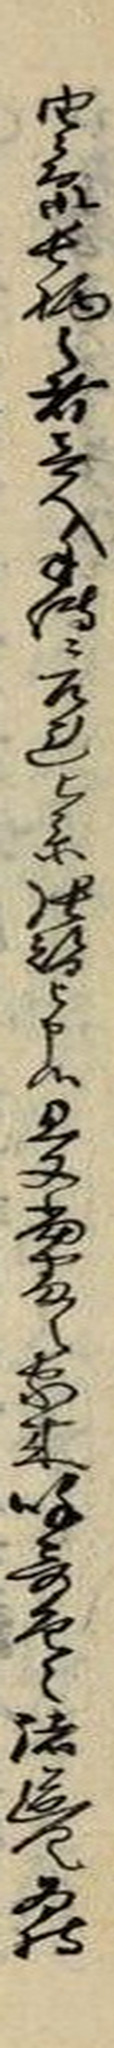由に而御長柄之者壱人手伝に召連被参張替被申候且又当番之家来呼寄色々諸道具為持
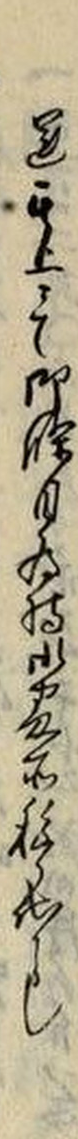置其上にて御条目為持御番移り代り申候
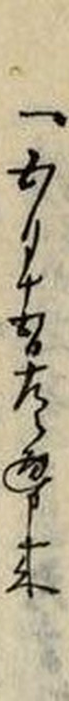一五月十五日左之通申来
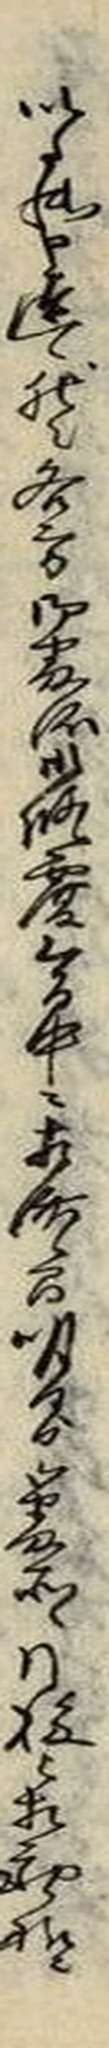以手紙申達候然は各方御番所御修覆今日中に相済候間明日ゟ御番所へ引移被相勤候様に
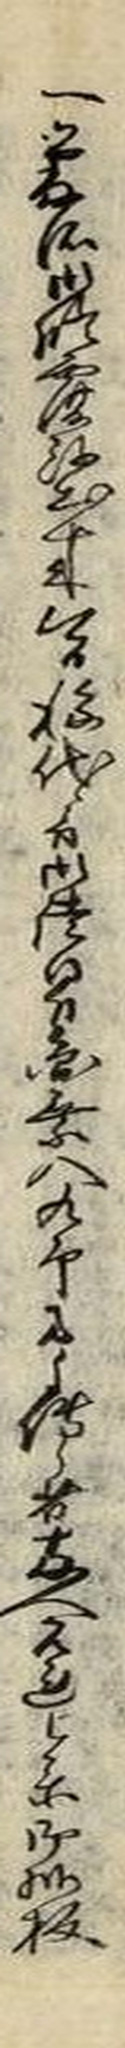一御番所御修覆致出来今日移代り候ニ付円乗八九郎方手伝之者両人召連被参御掛板
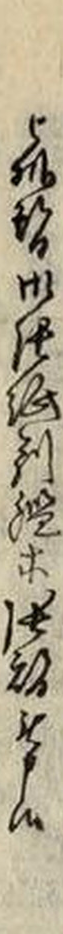被掛替御張紙印鑑等張替被申候
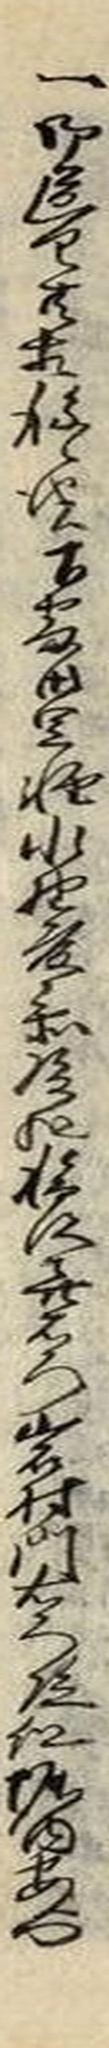一御道具共相移候儀は下番御足軽水野藤兵衛殿組橋沢喜右衛門岩村門右衛門殿組堀内安右衛門
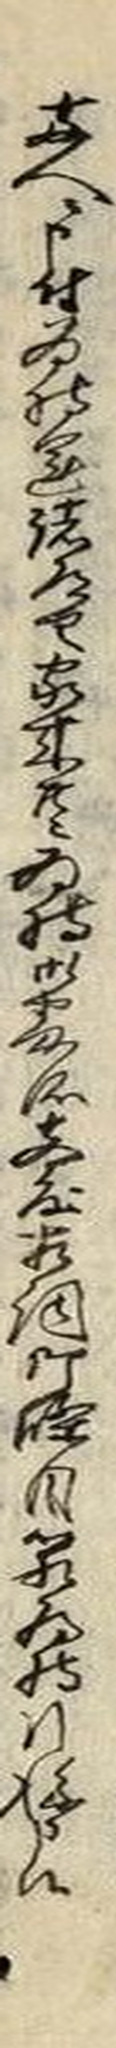両人に申付為持運諸道具家来共に為持御番所支度相調御条目箱為持引移申候
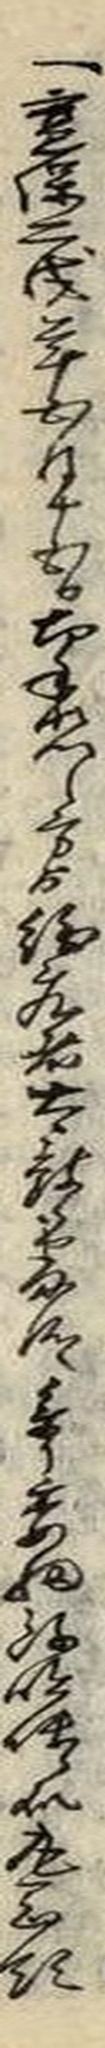一享保二戌年五月十五日切手御門方ゟ紛敷者太鼓御番所へ参り委細致吟味候処丸岡領
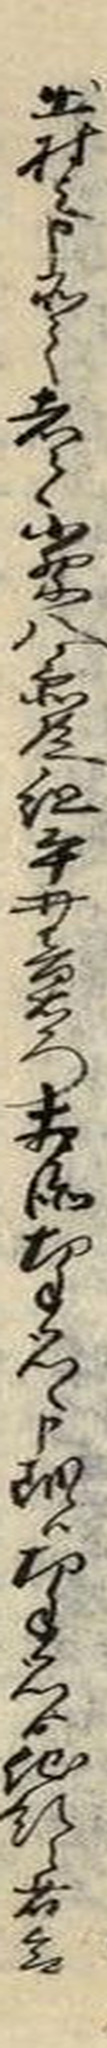出村と申所之者に候小栗八兵衛殿組平井音右衛門相添切手御門へ申越候ハ切手御門ゟ他領之者参
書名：御門御櫓之部
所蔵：福井県文書館 Fukui Prefectural Archives
